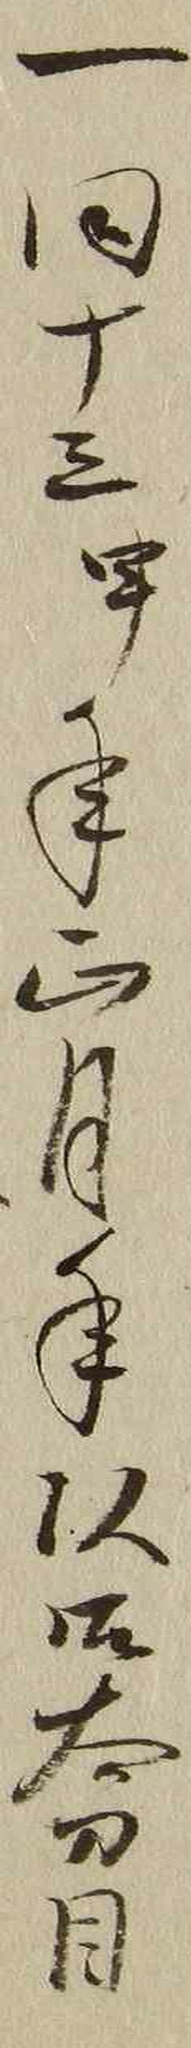一同十三申年正月年頭御太刀目
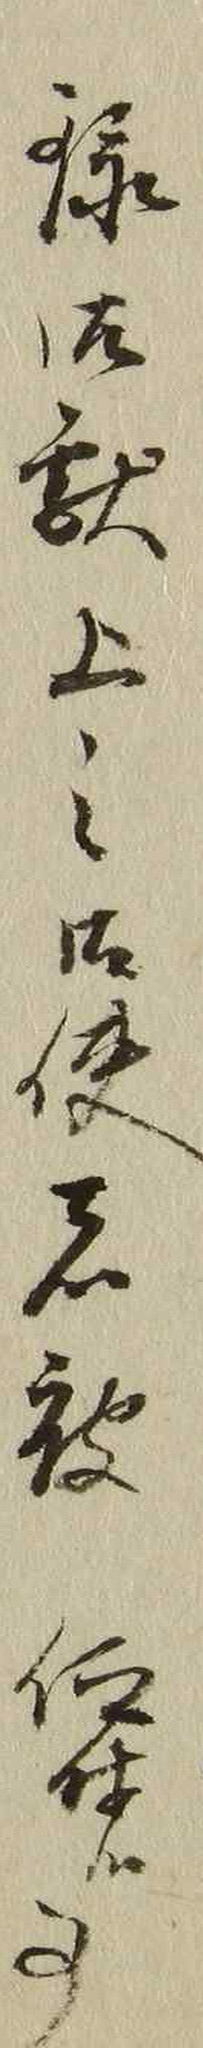録御献上之御使者被仰付候事
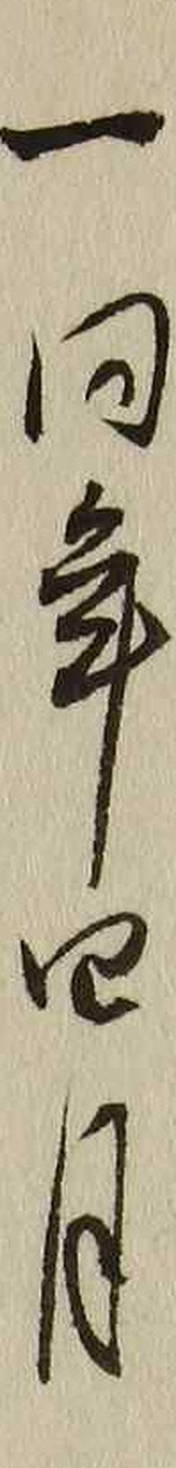一同年四月
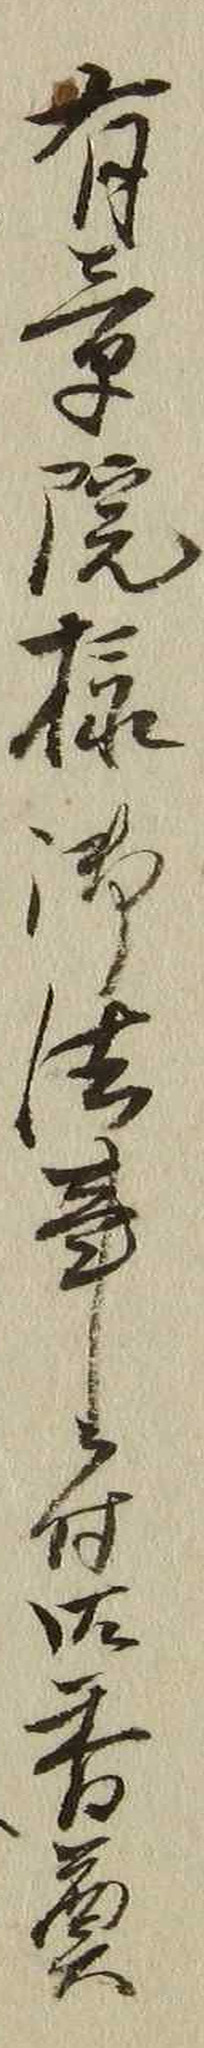有章院様御法事ニ付御香奠
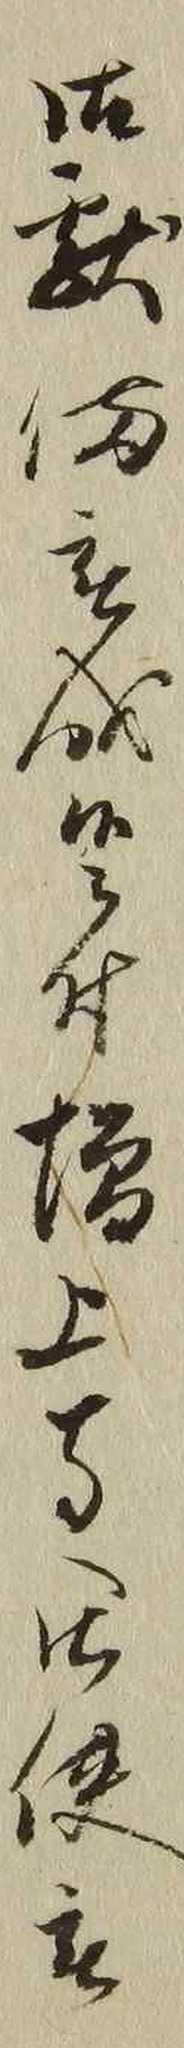御献備被成候ニ付増上寺へ御使被
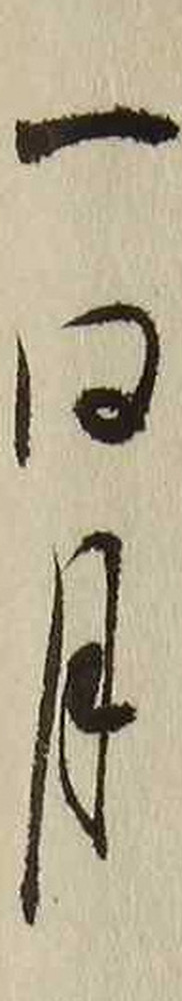一同月
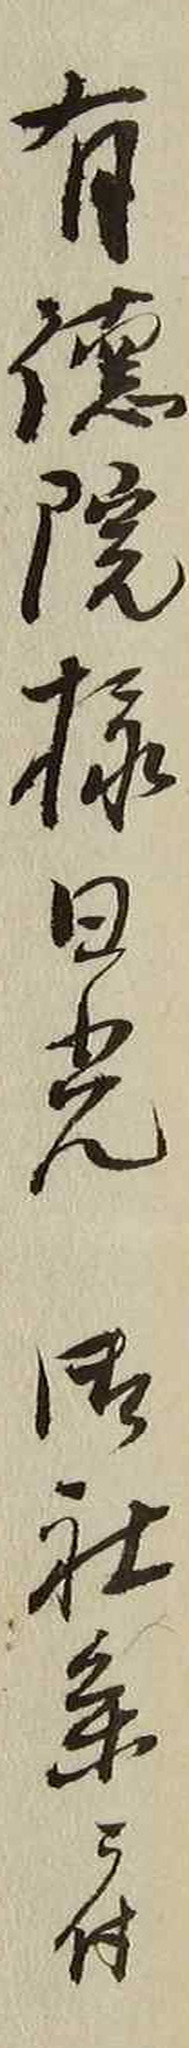有徳院様日光御社参ニ付
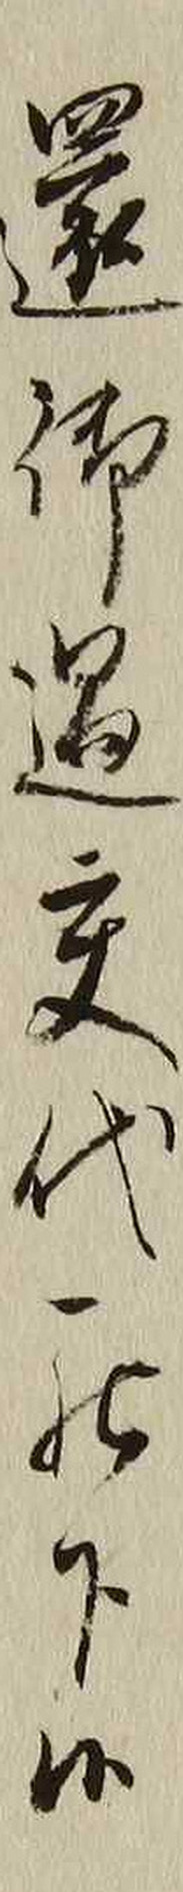還御過交代罷下候
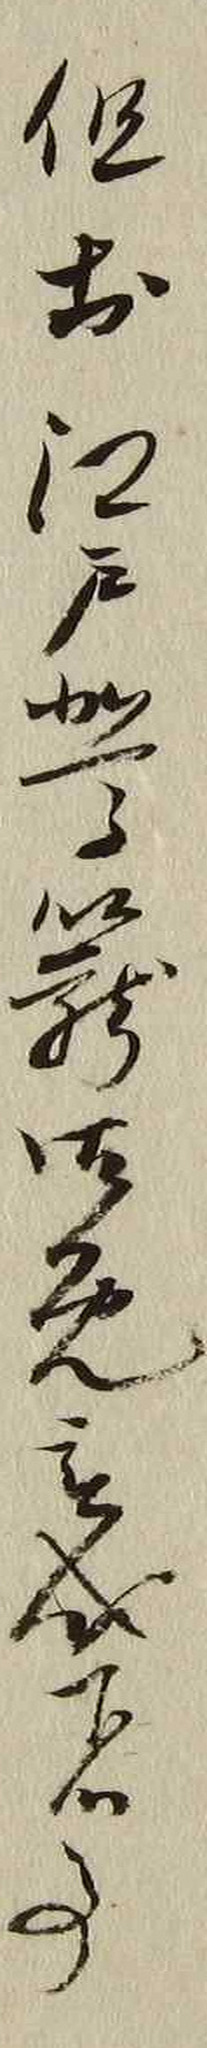但於江戸駕籠御免被成下候事
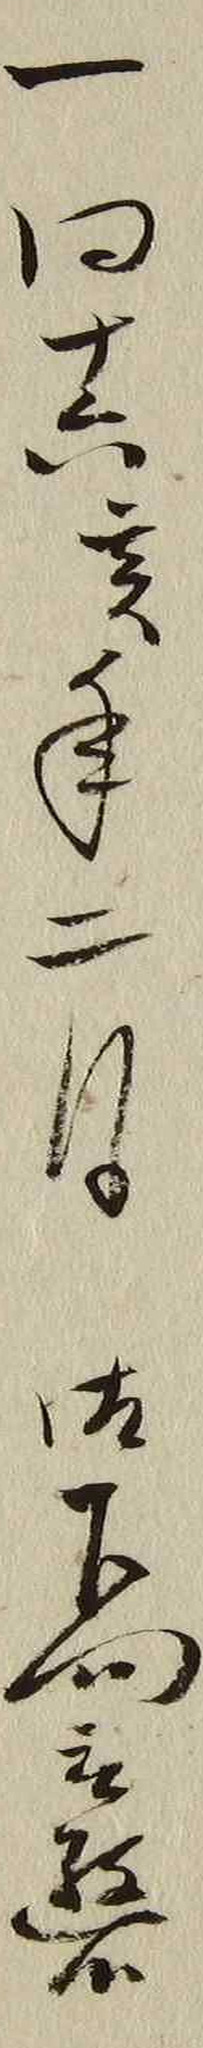一同十六亥年二月御下向被遊候
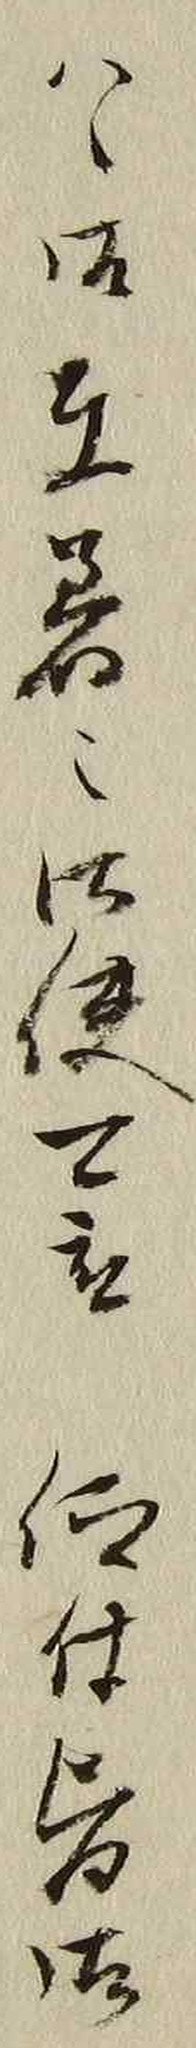ハヽ御在着之御使可被仰付旨御
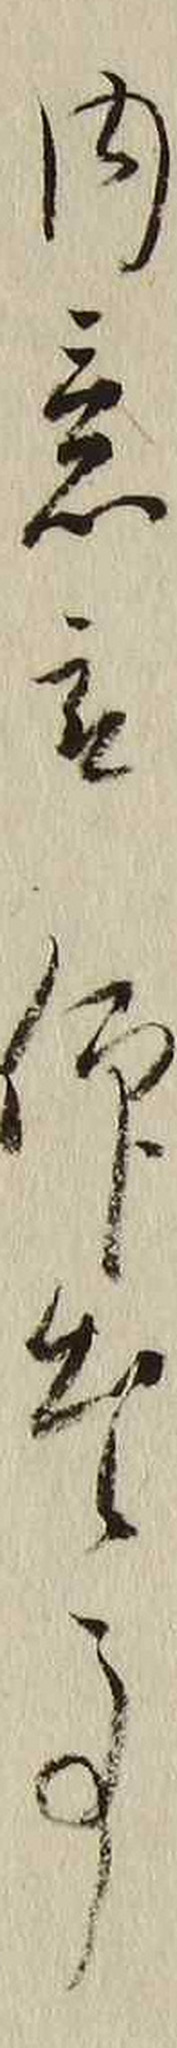内意被仰出候事
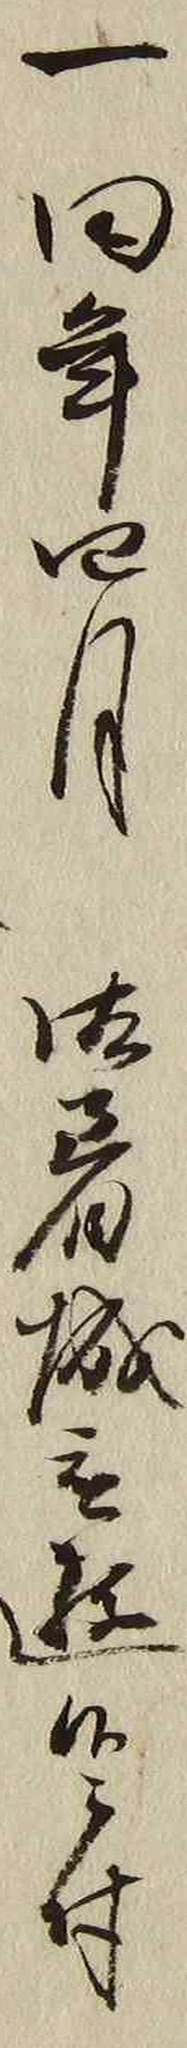一同年四月御着城被遊候ニ付
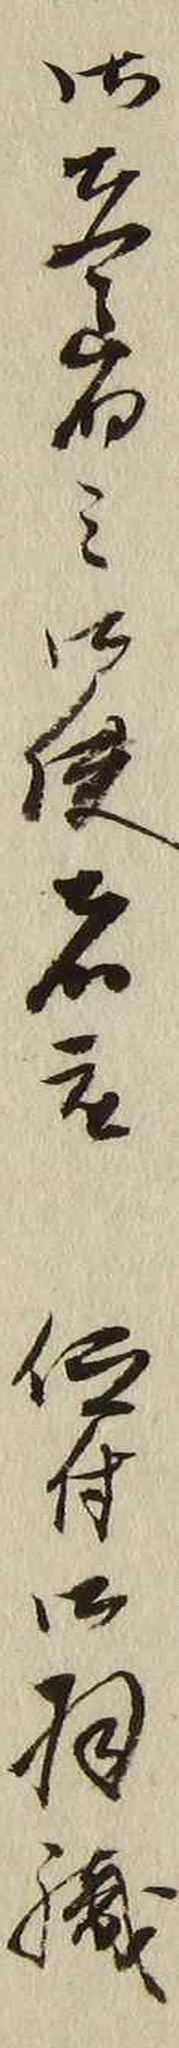御在着之御使者被仰付御羽織
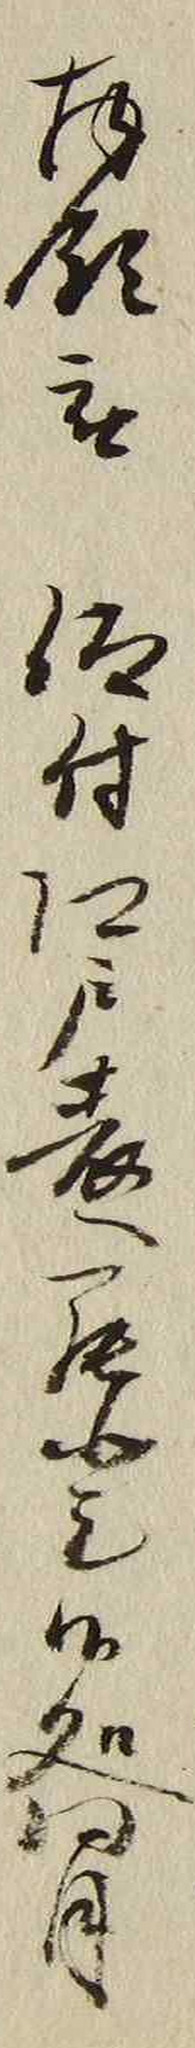拝領被仰付江戸表へ罷登候処同月
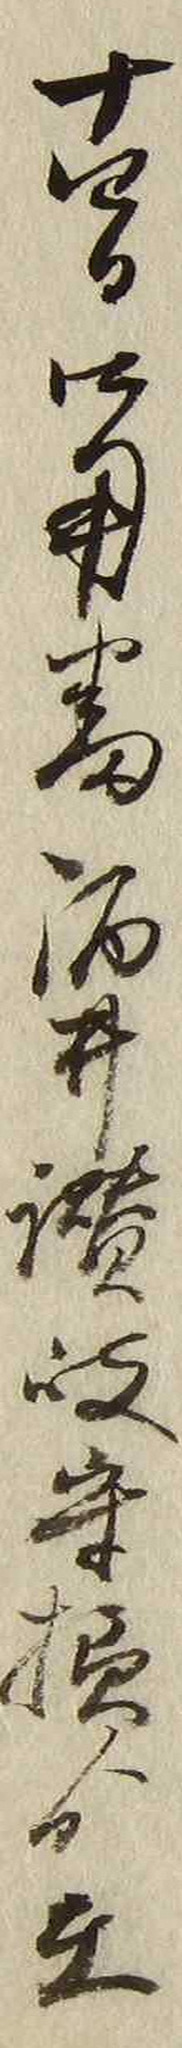十四日御用番酒井讃岐守様ゟ在
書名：諸士系譜　巻之351　す之部1
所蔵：会津若松市立会津図書館
